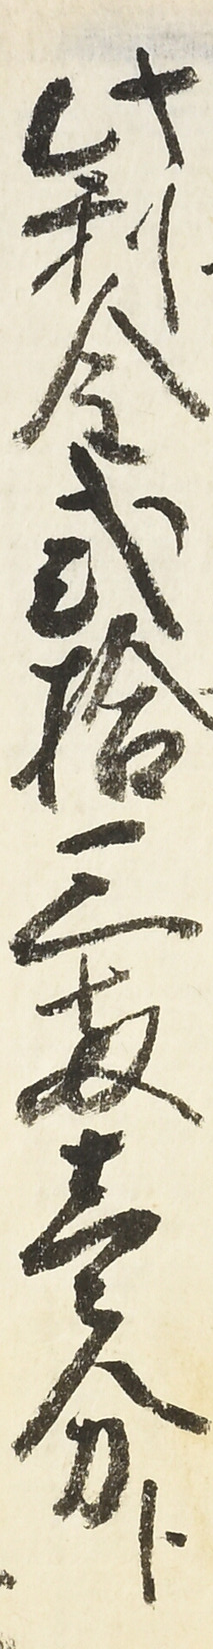此利金弐拾三両壱分ト
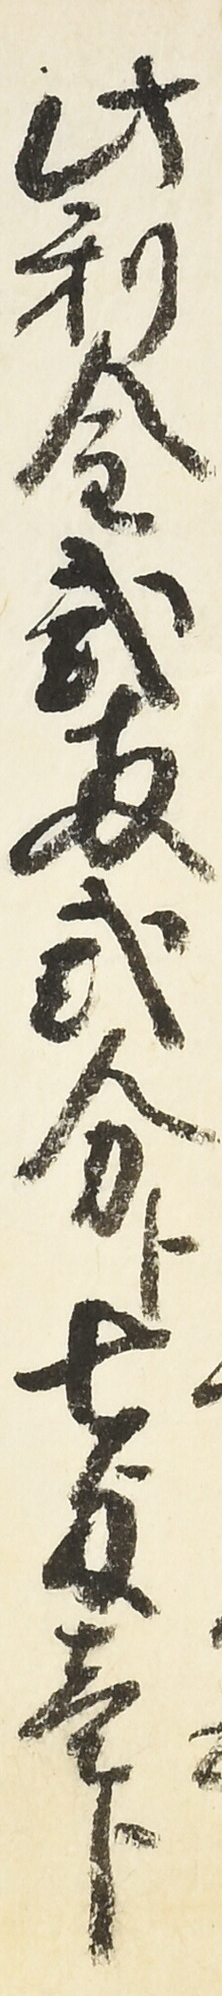此利金弐両弐分ト七匁壱分
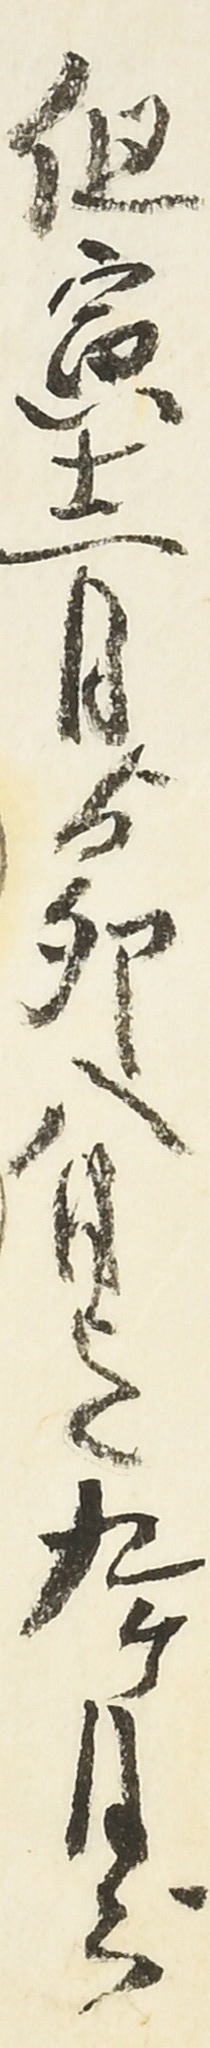但寅ノ十二月ゟ卯八月迄九ヶ月分
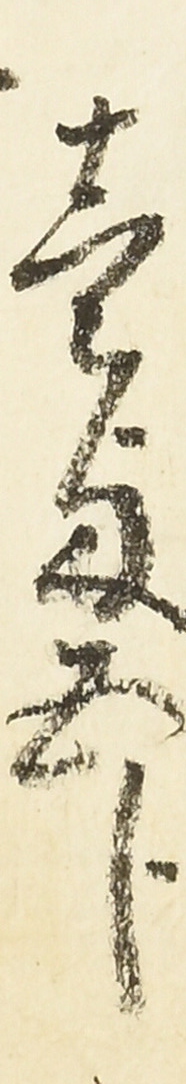壱匁五分
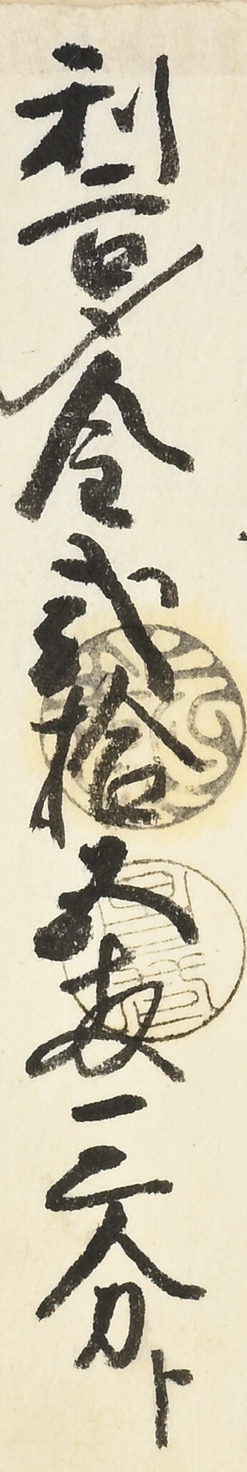利ニ口〆金弐拾五両三分ト
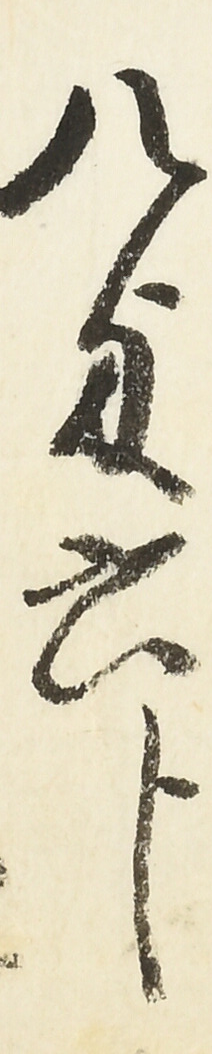八匁六分
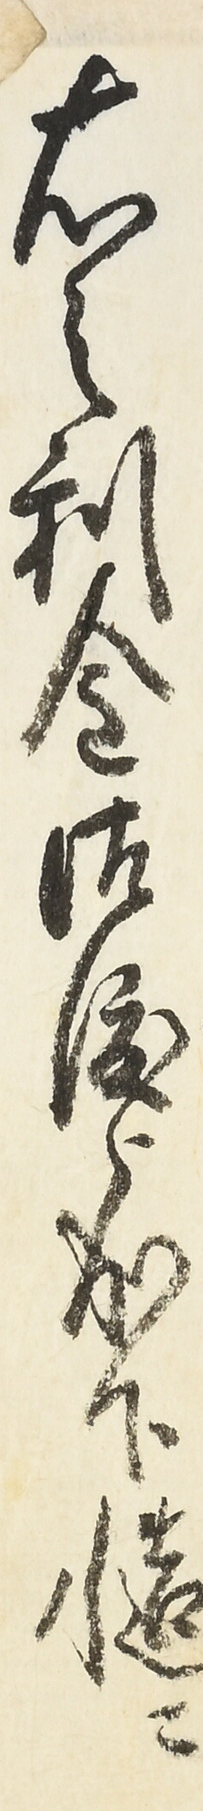右之利金御渡被成下慥ニ

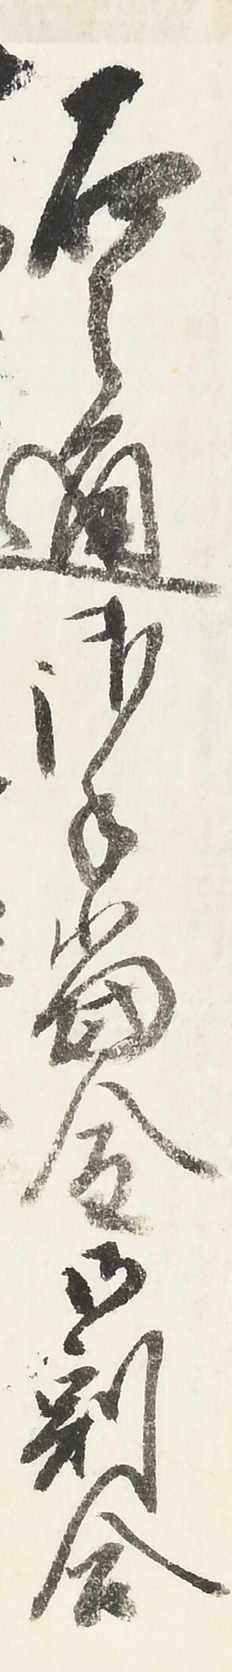右之通御手当金御割合
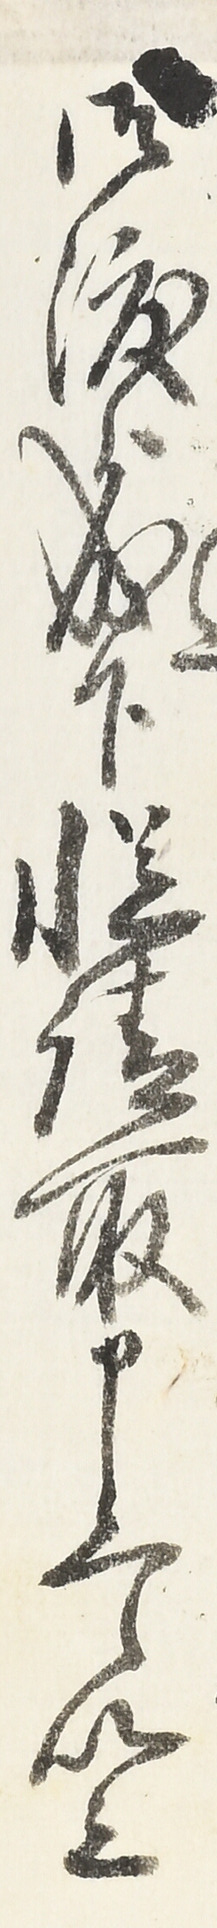御渡被成下慥請取申上候以上
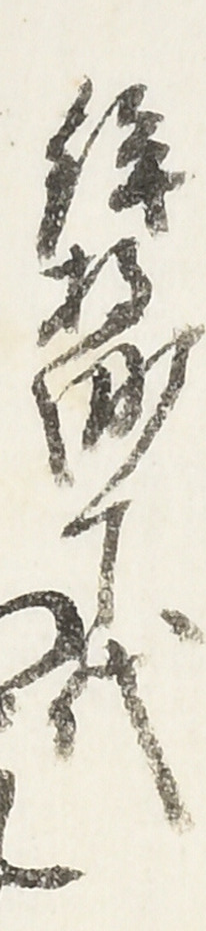鉾持町丁代
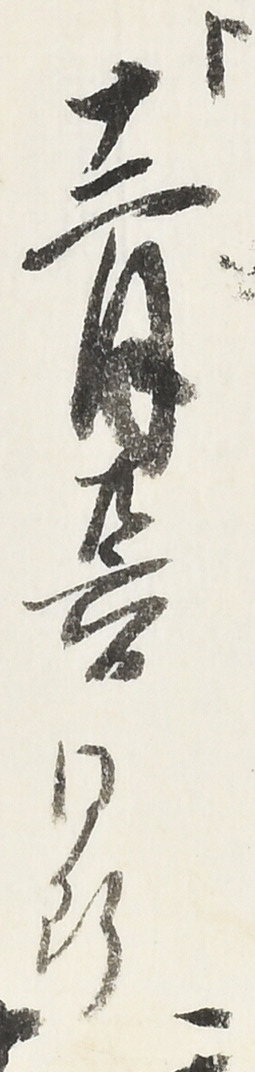十二月廿六日同断
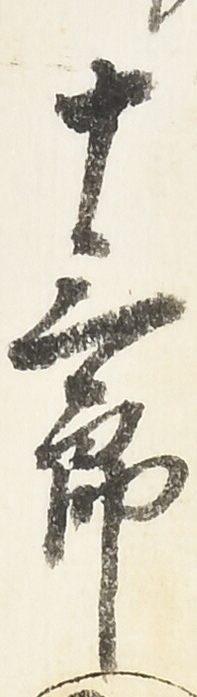十三郎
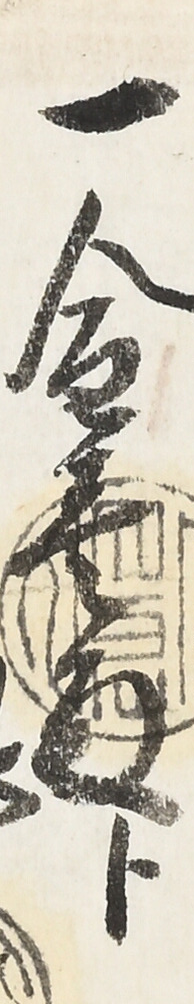一金壱両ト
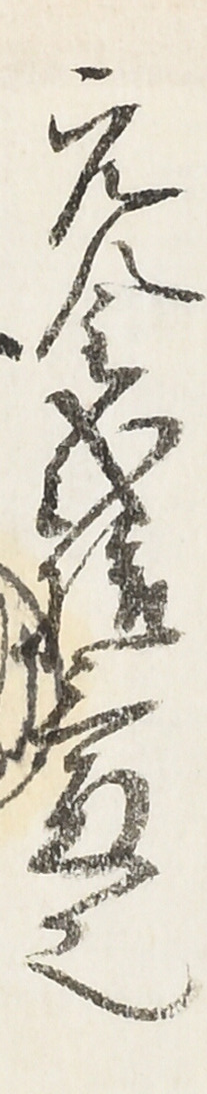元金弐拾三両也
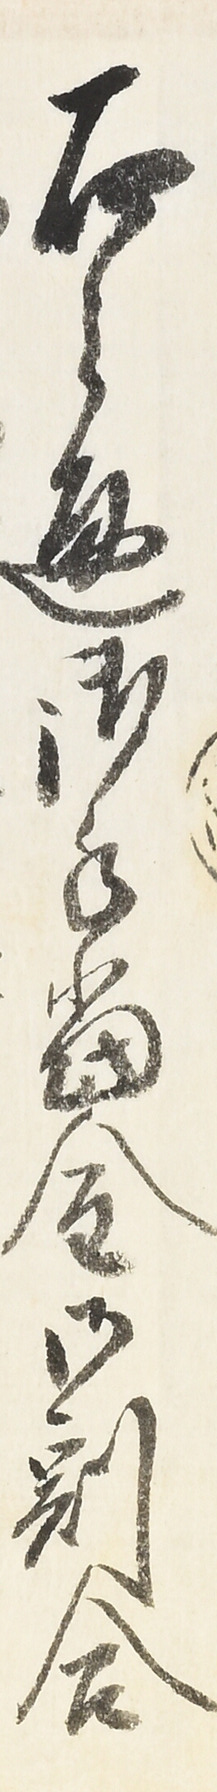右之通御手当金御割合
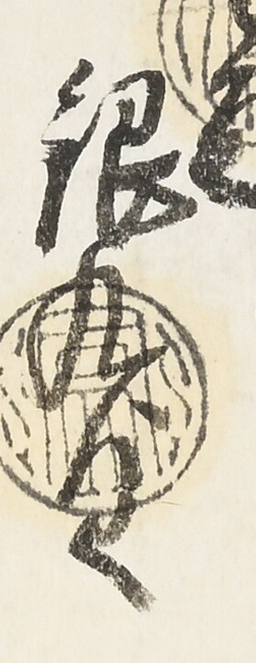銀九匁
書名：御才覚金御利足割渡扣帳
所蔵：伊那市立高遠町図書館・合同会社AMANE
